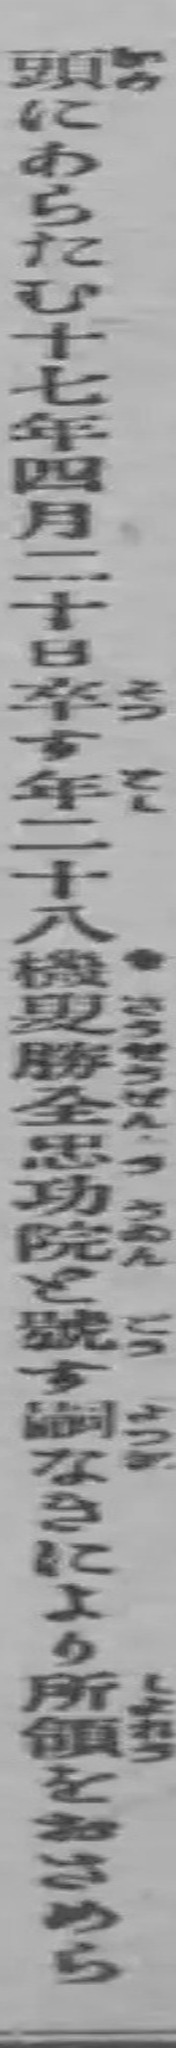頭にあらたむ十七年四月二十日卒す年二十八機叟勝全忠功院と号す嗣なきにより所領をおさめら
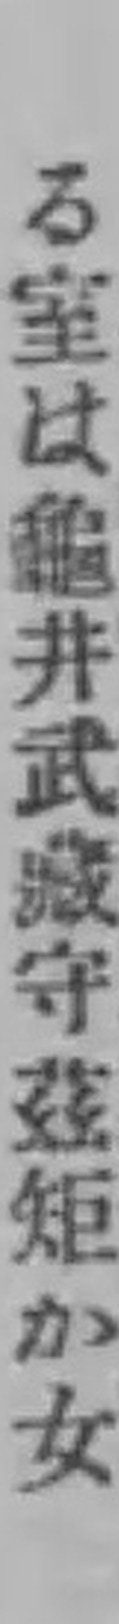る室は亀井武蔵守茲矩か女
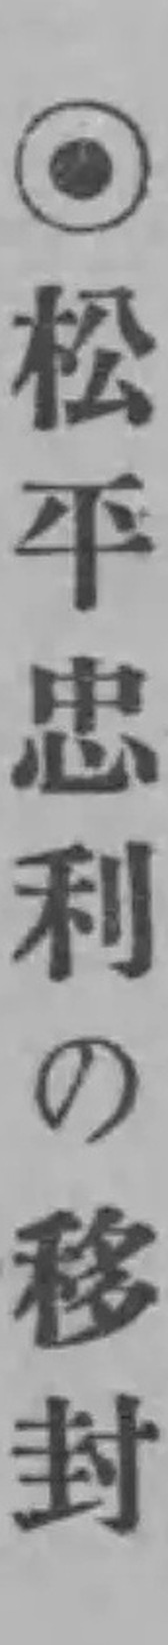⦿松平忠利の移封
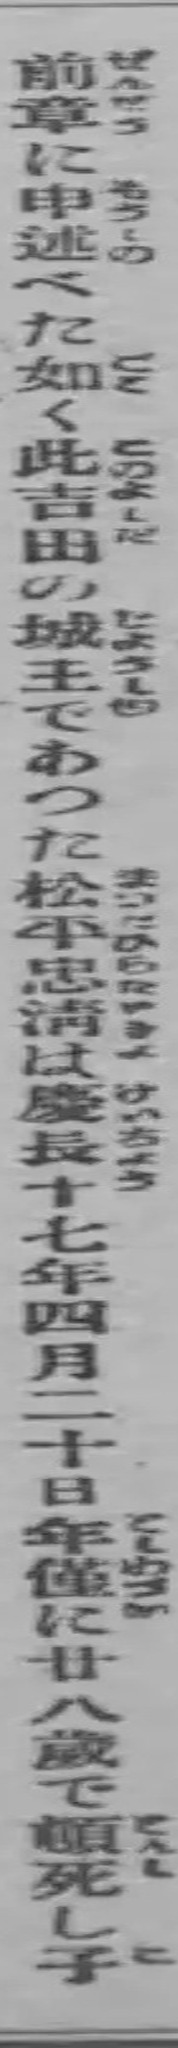前章に申述べた如く此吉田の城主であつた松平忠清は慶長十七年四月二十日年僅かに廿八歳で頓死し子
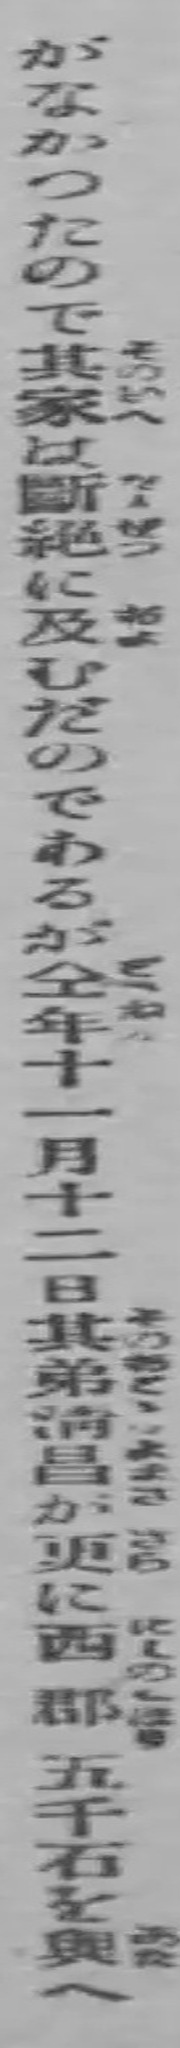がなかつたので其家は断絶に及むだのであるが仝年十一月十二日其弟清昌が更に西郡五千石を与へ
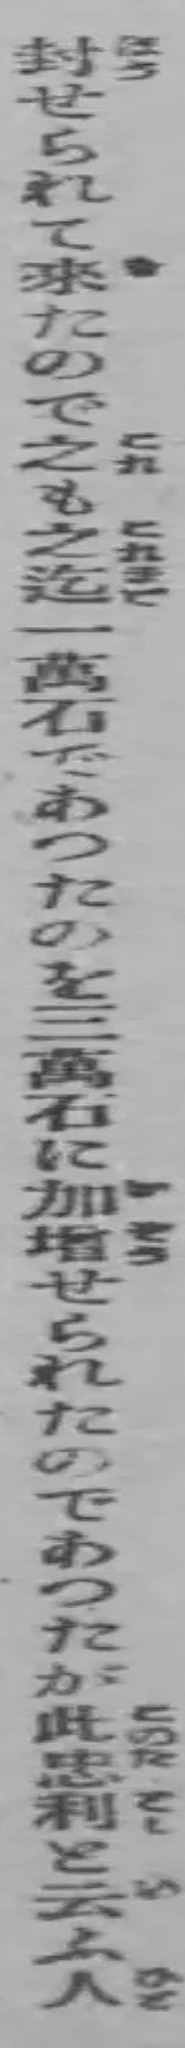封せられて来たので之も之迄一万石であつたのを三万石に加増せられたのであつたが此忠利と云ふ人
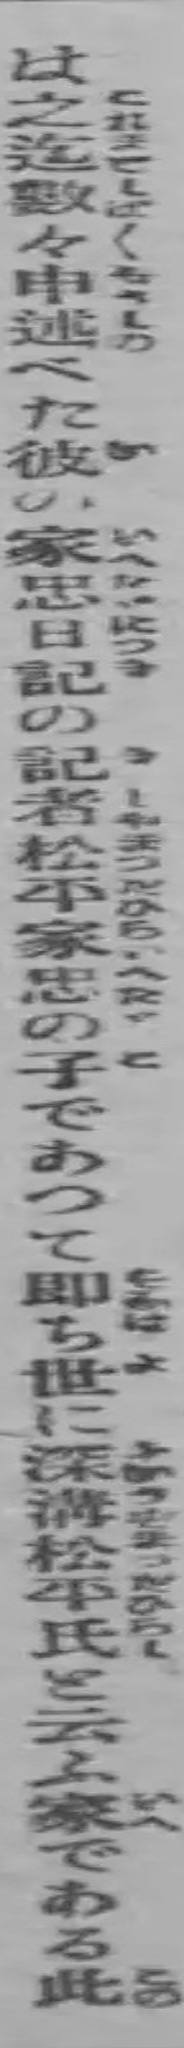深溝の松平は之迄数々申述べた彼の家忠日記の記者松平家忠の子であつて即ち世に深溝松平氏と云ふ家である此
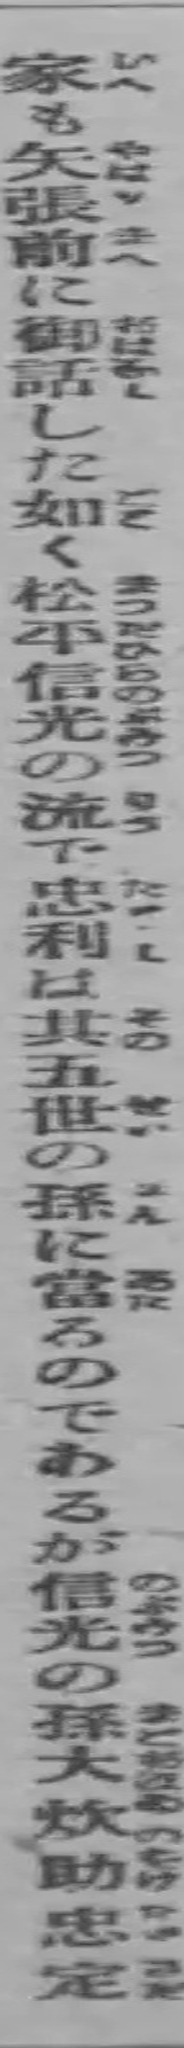家も矢張前に御話した如く松平信光の流で忠利は其五世の孫に当るのであるが信光の孫大炊助忠定
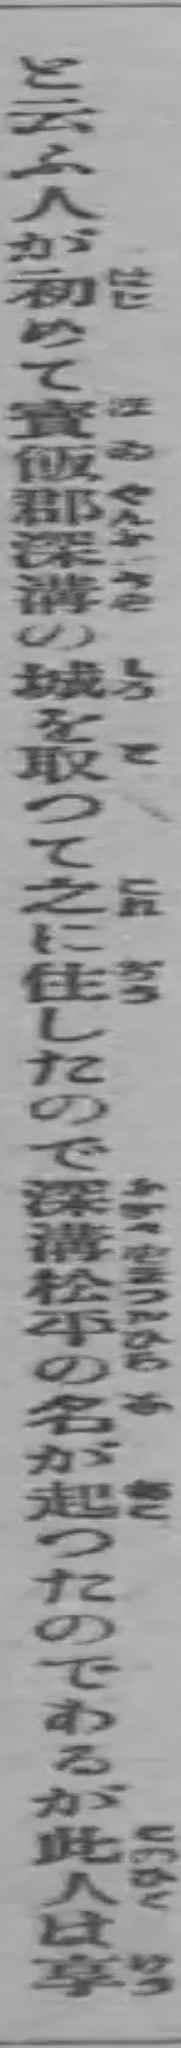と云ふ人が初めて宝飯郡深溝の城を取つて之に住したので深溝松平の名が起つたのであるが此人は享

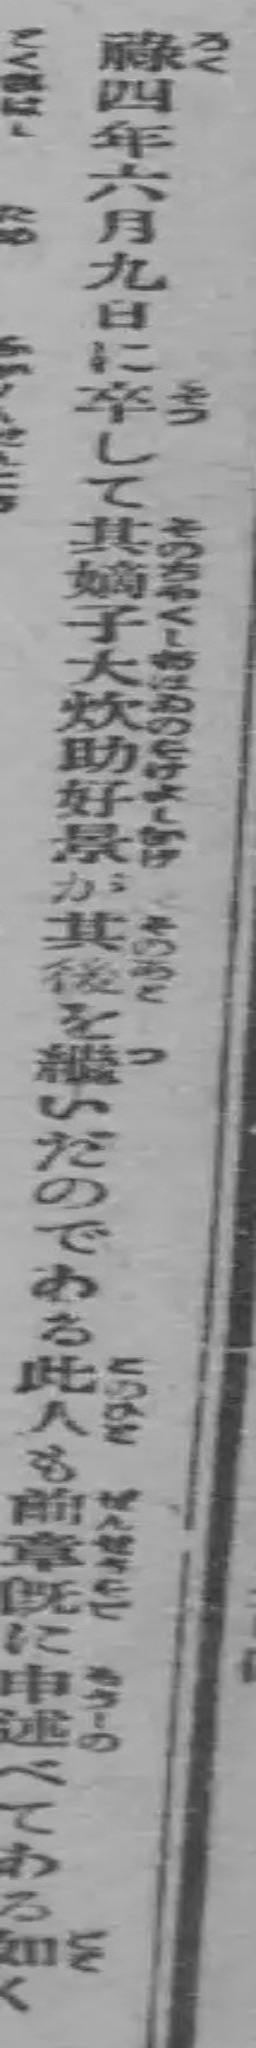大炊助好景禄四年六月九日に卒して其嫡子大炊助好景が其後を継いだのである此人も前章既に申述べてある如く
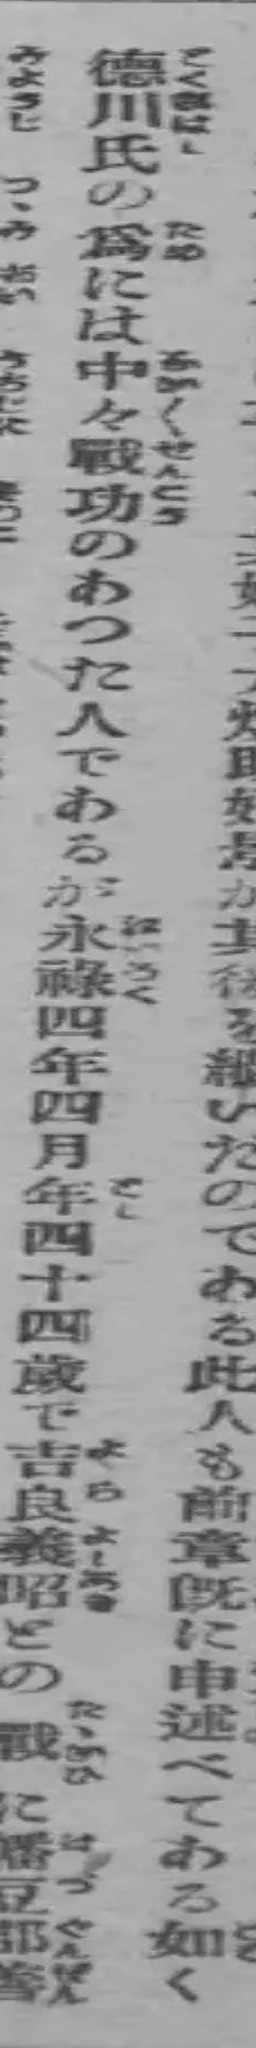徳川氏の為には中々戦功のあつた人であるが永禄四年四月年四十四歳で吉良義昭との戦に幡豆郡善
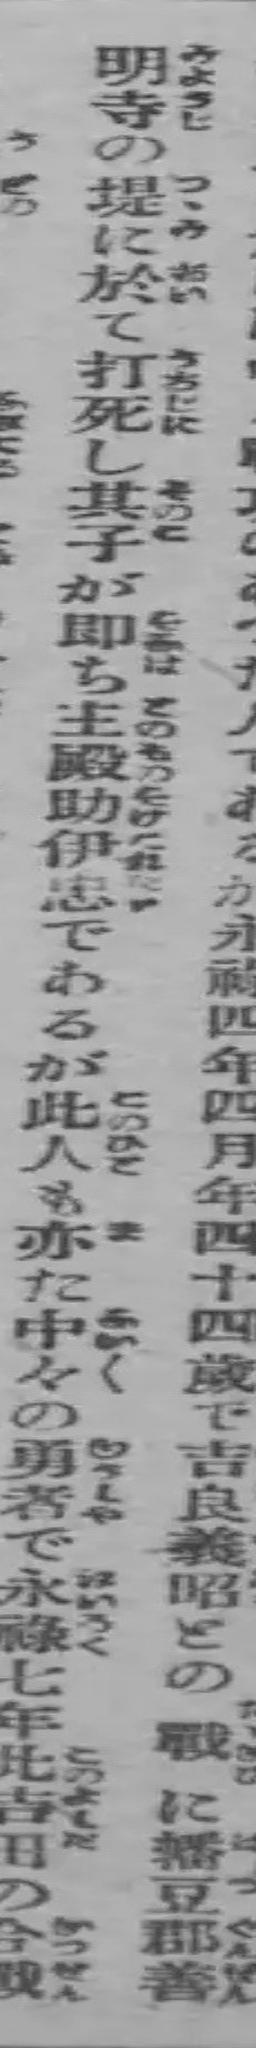主殿助伊忠明寺の堤に於て打死し其子が即ち主殿助伊忠であるが此人も亦た中々の勇者で永禄七年此吉田の合戦
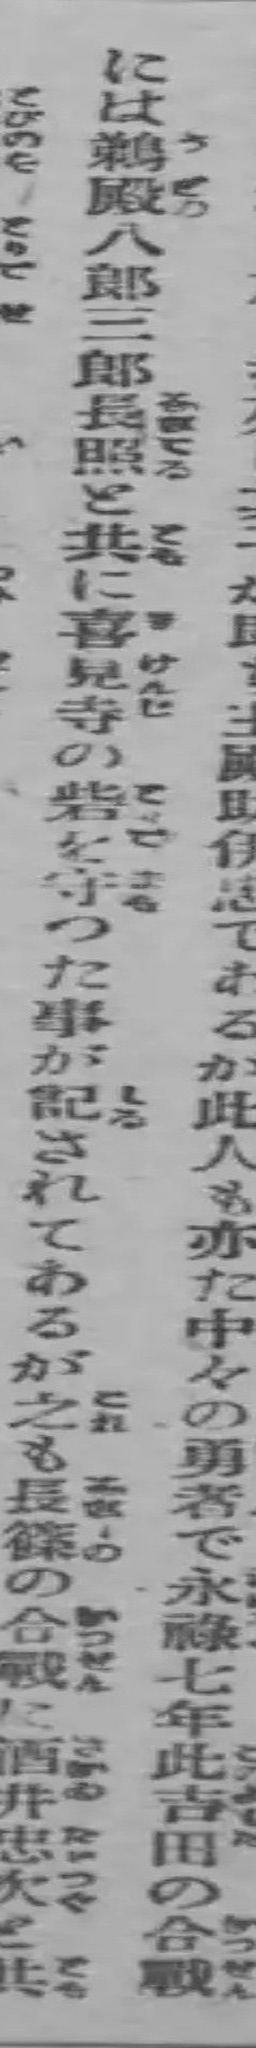には鵜殿八郎三郎長照と共に喜見寺の砦を守つた事が記されてあるが之も長篠の合戦に酒井忠次と共
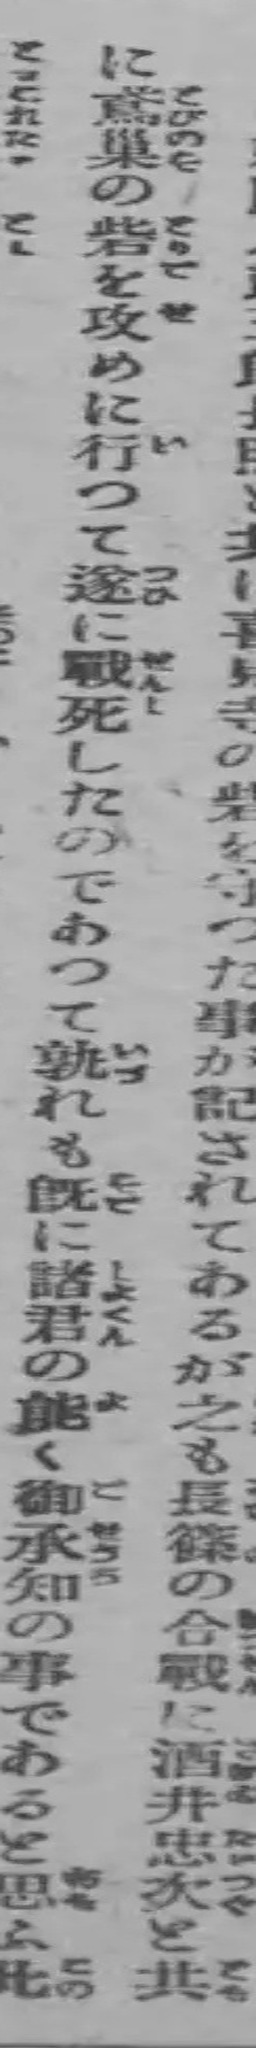に鳶巣の砦を攻めに行つて遂に戦死したのであつて孰れも既に諸君の能く御承知の事であると思ふ此
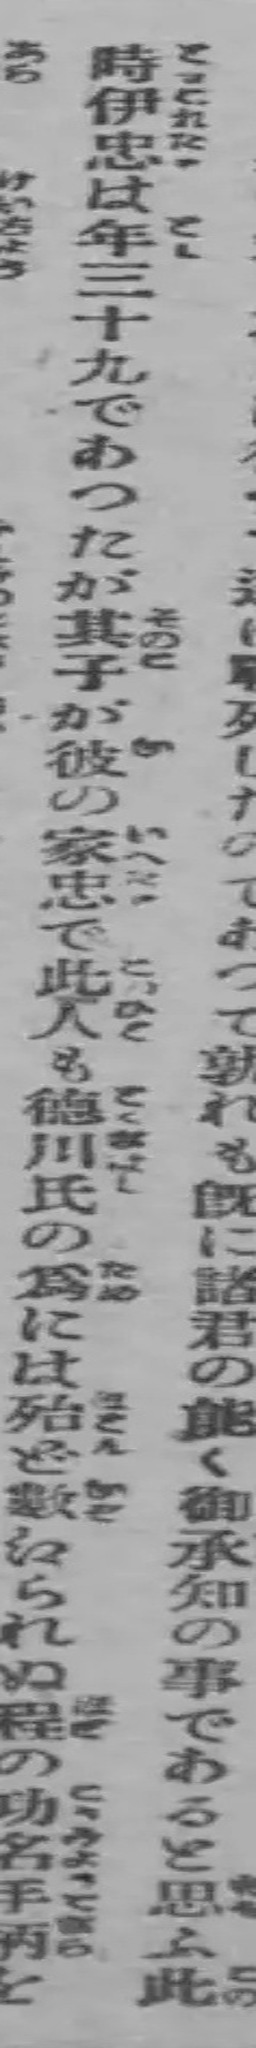主殿助家忠時伊忠は年三十九であつたが其子が彼の家忠で此人も徳川氏の為には殆ど数えられぬ程の功名手柄を
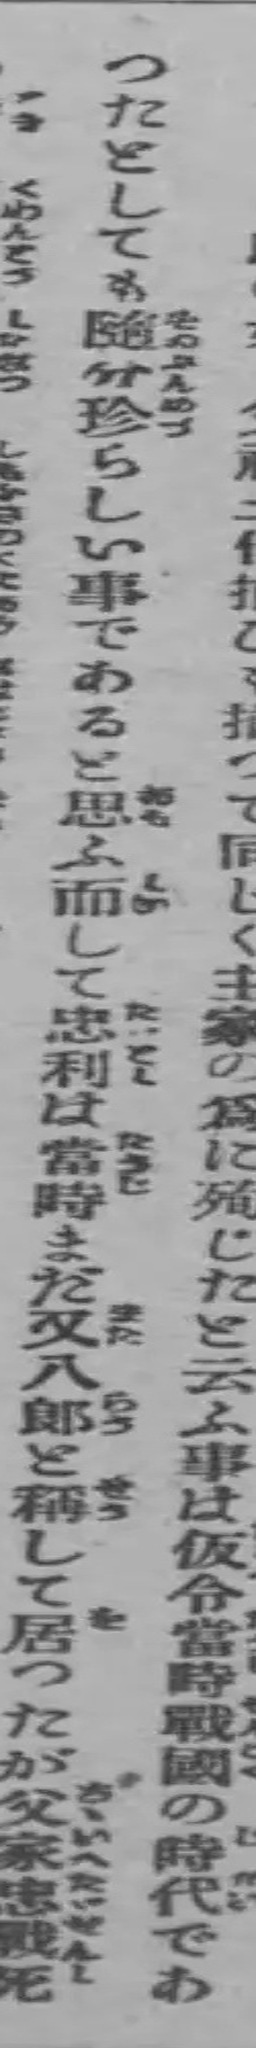つたとしても随分珍らしい事であると思ふ而して忠利は当時まだ又八郎と称して居つたが父家忠戦死
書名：豊橋市史談
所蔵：国立国会図書館 National Diet Library, JAPAN
